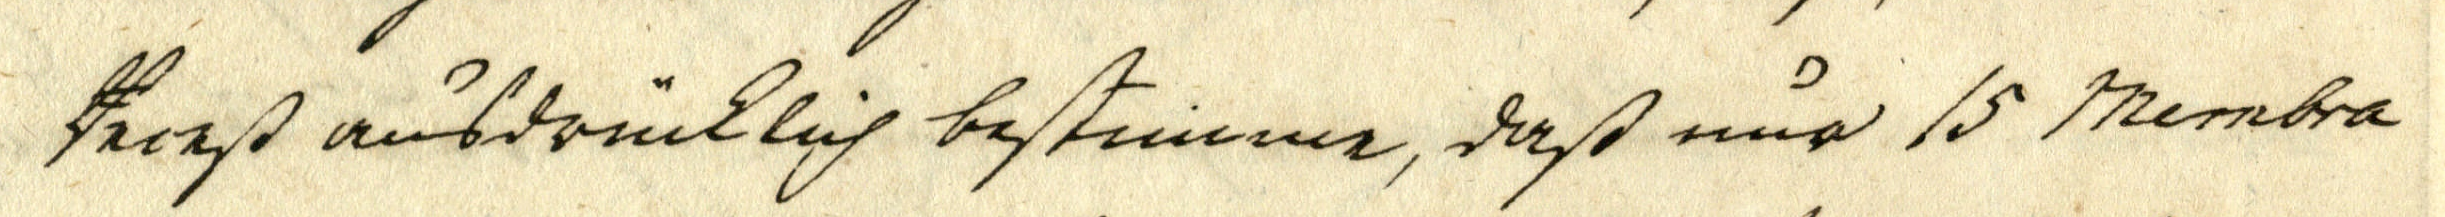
Receß ausdrücklich bestimme, daß nur 15 Membra
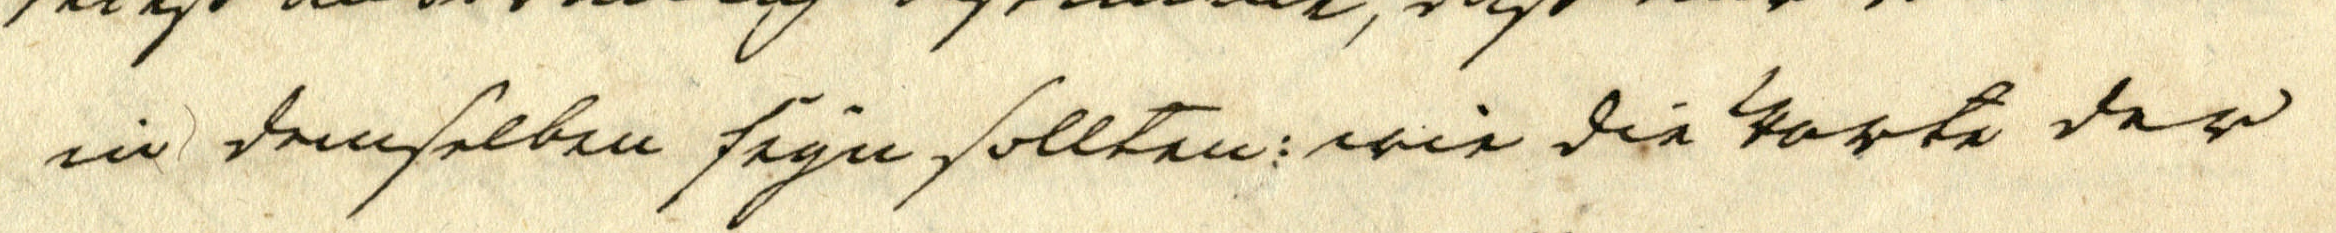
in demselben seÿn sollten, wie die Worte der
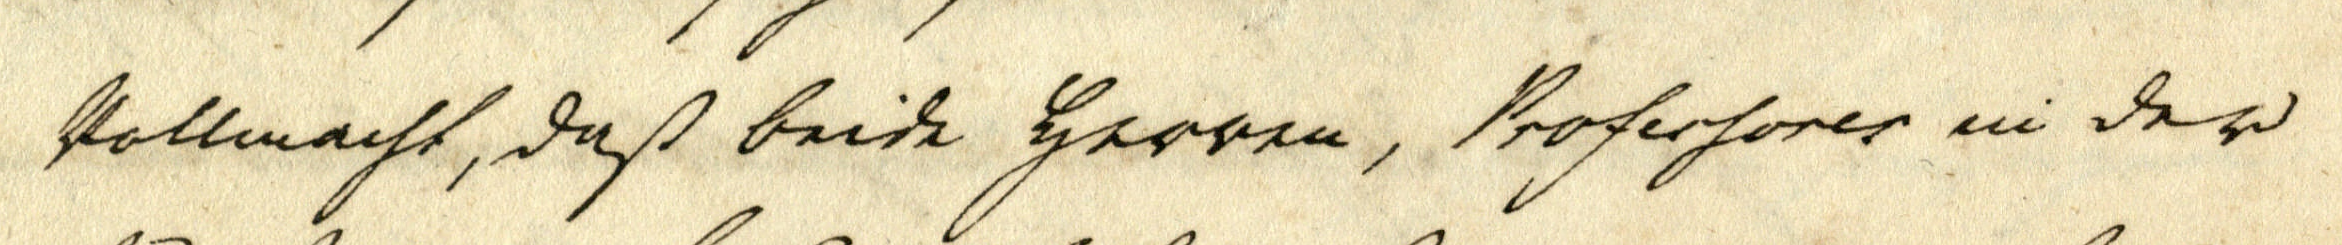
Vollmacht, daß beide Herren, Professores in der
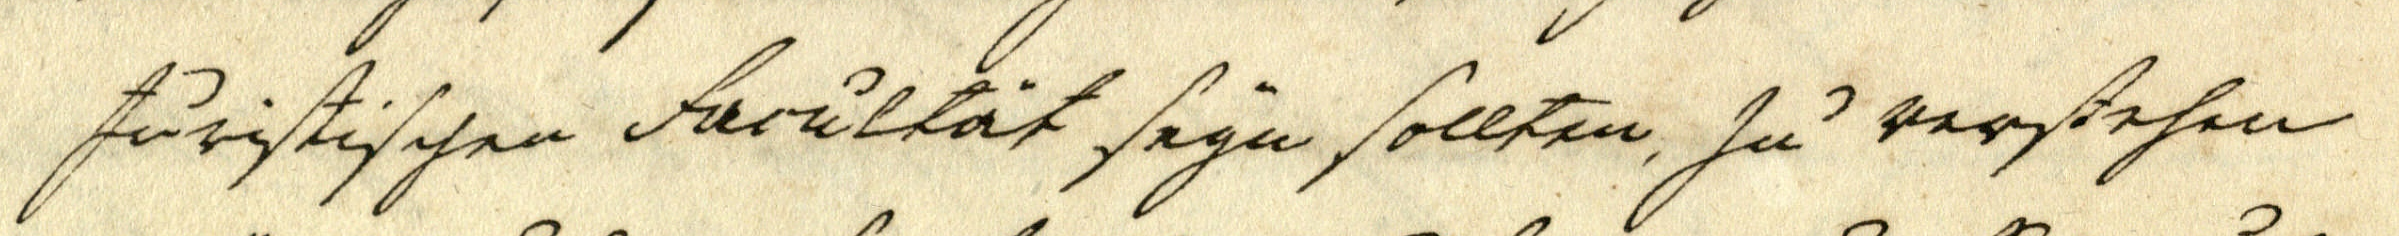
Juristischen Facultät seÿn solltn, zu verstehen
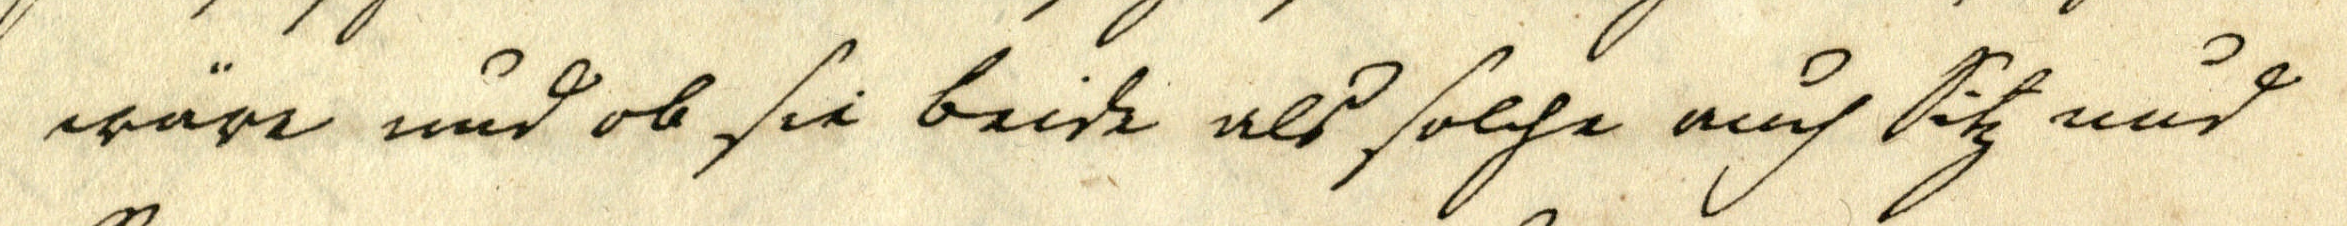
wäre und ob sie beide als solche auch Sitz und
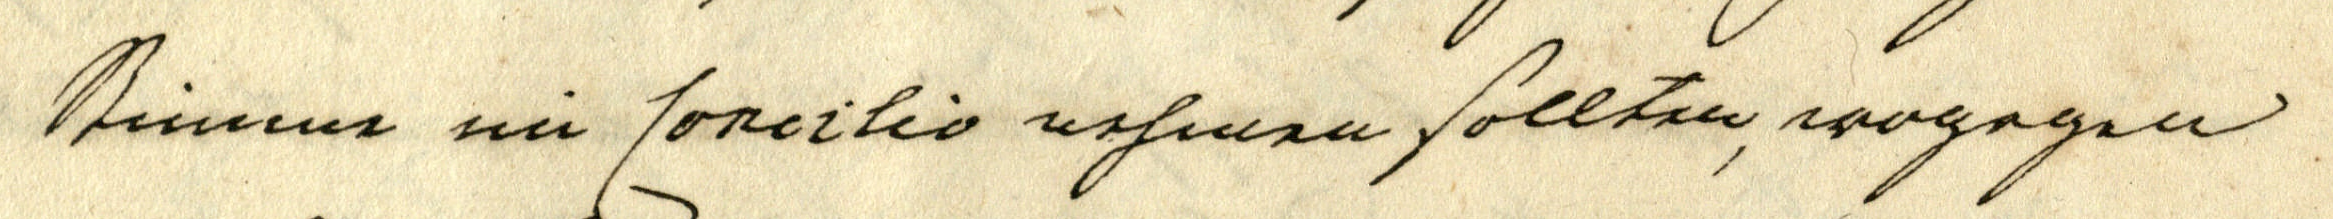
Stimme im Concilio nehmen sollten, wogegen
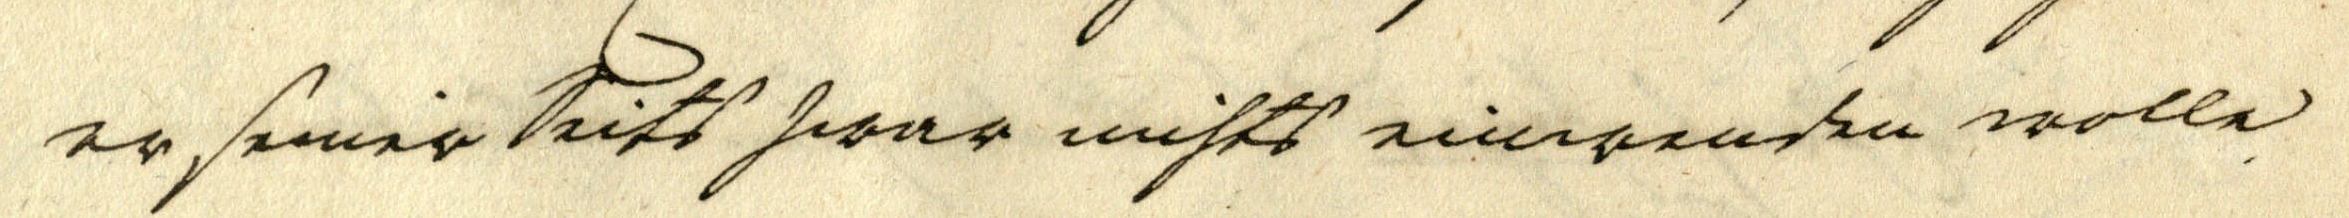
er seiner Seits zwar nichts einwenden wolle,
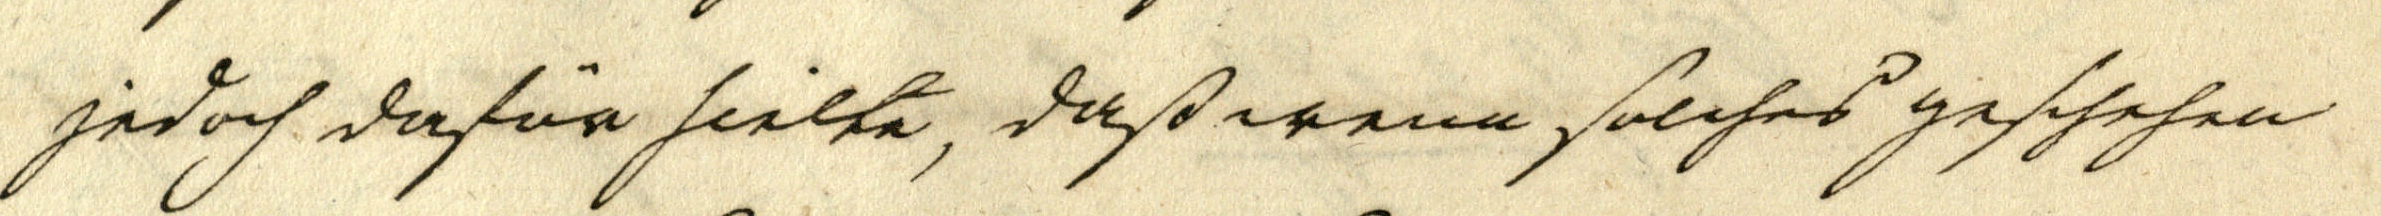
jedoch dafür hielte, daß wenn solches geschehen
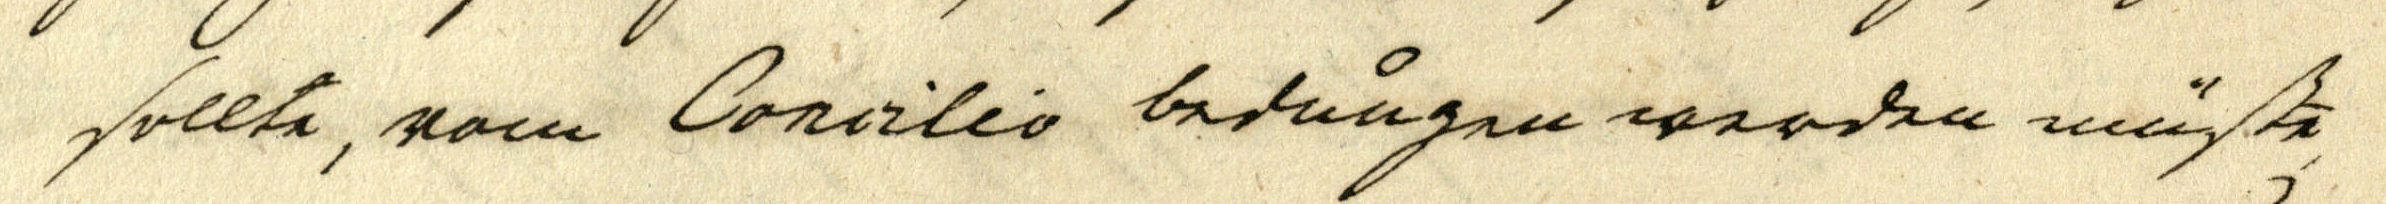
sollte, vom Concilio bedungen werden müste,
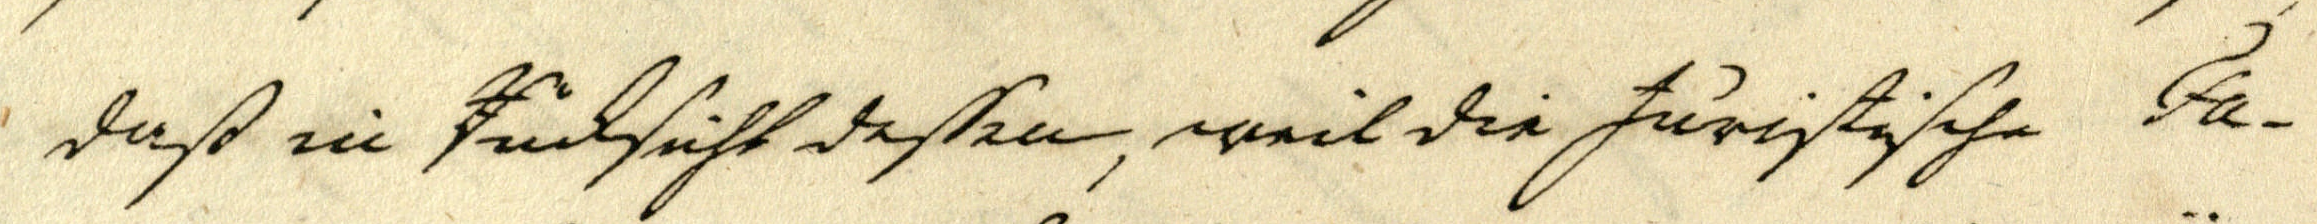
daß in Rücksicht dessen, weil die Juristische Fa¬
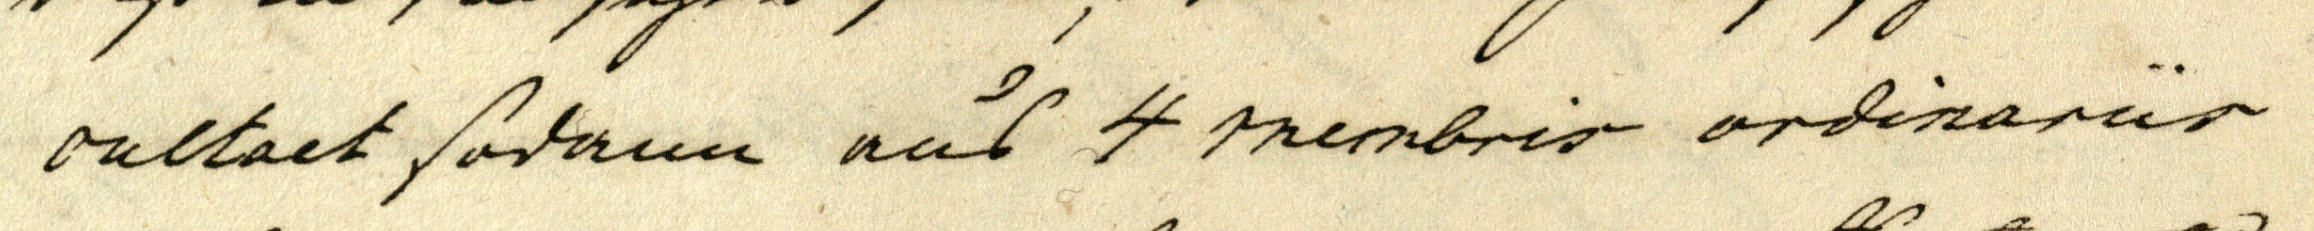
cultaet sodann aus 4 membris ordinariis
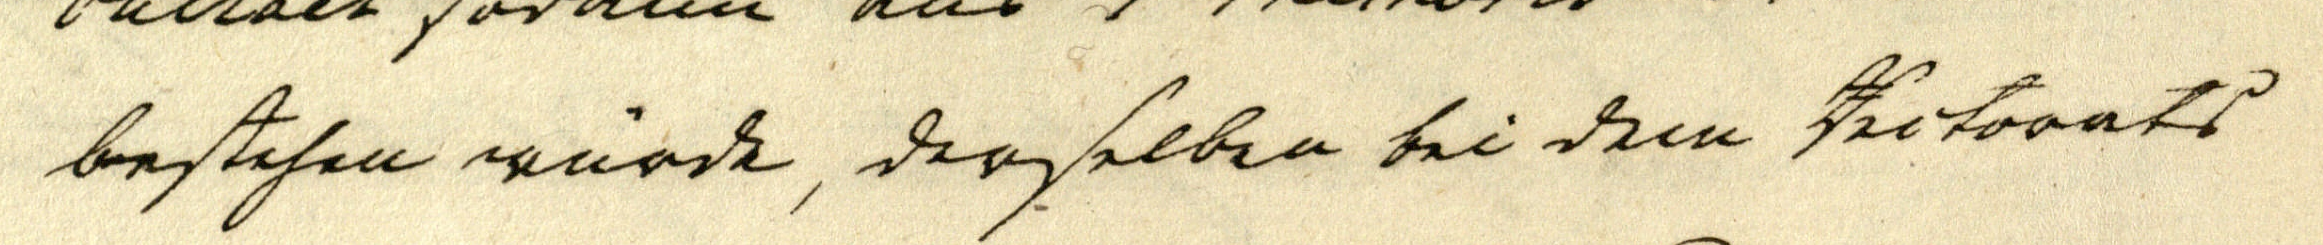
bestehen würde, derselben bei dem Rectorats
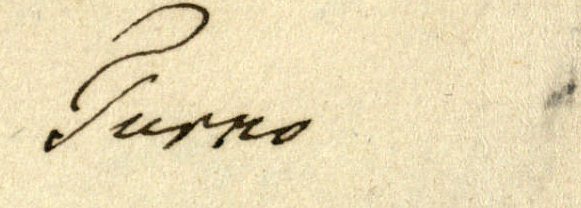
Turno
